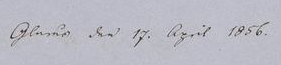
Glarus den 17. April 1856.
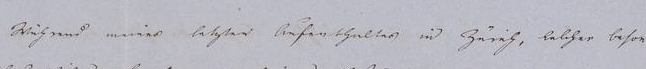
Während meines letzten Aufenthaltes in Zürich , welcher beson-
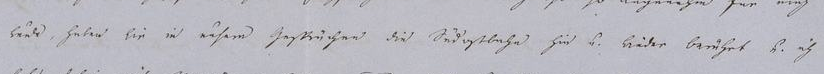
wurde, haben wir in unsern Gesprächen die Südostbahn hin u. wieder berührt u. ich
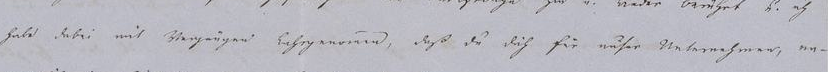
habe dabei mit Vergnügen wahrgenommen, daß Du Dich für unser Unternehmen, na-
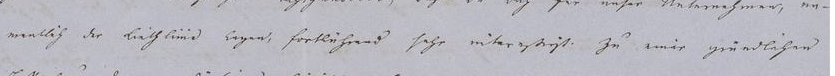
mentlich der Linthlinie wegen, fortwährend sehr intereßirst. Zu einer gründlichen
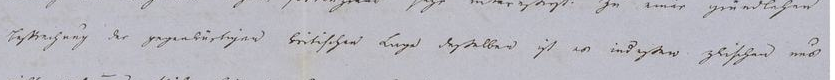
Besprechung der gegenwärtigen kritischen Lage deßelben ist es indeßen zwischen uns
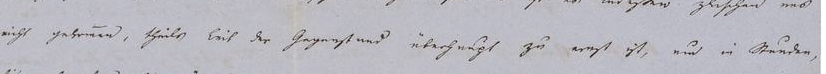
nicht gekommen, theils weil der Gegenstand überhaupt zu ernst ist, um in Stunden,
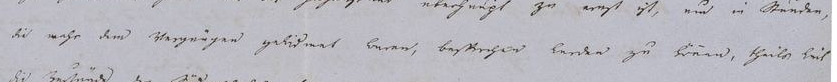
die mehr dem Vergnügen gewidmet waren, besprochen werden zu können, theils weil
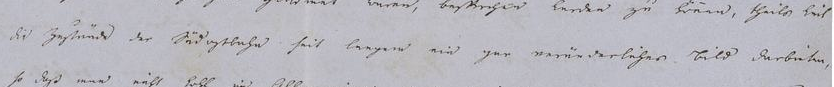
die Zustände der Südostbahn seit langem ein gar veränderliches Bild darbieten,
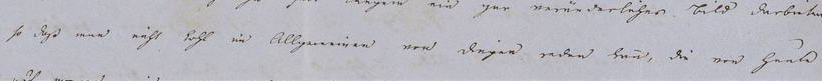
so daß man nicht wohl im Allgemeinen von Dingen reden kann, die von heute
